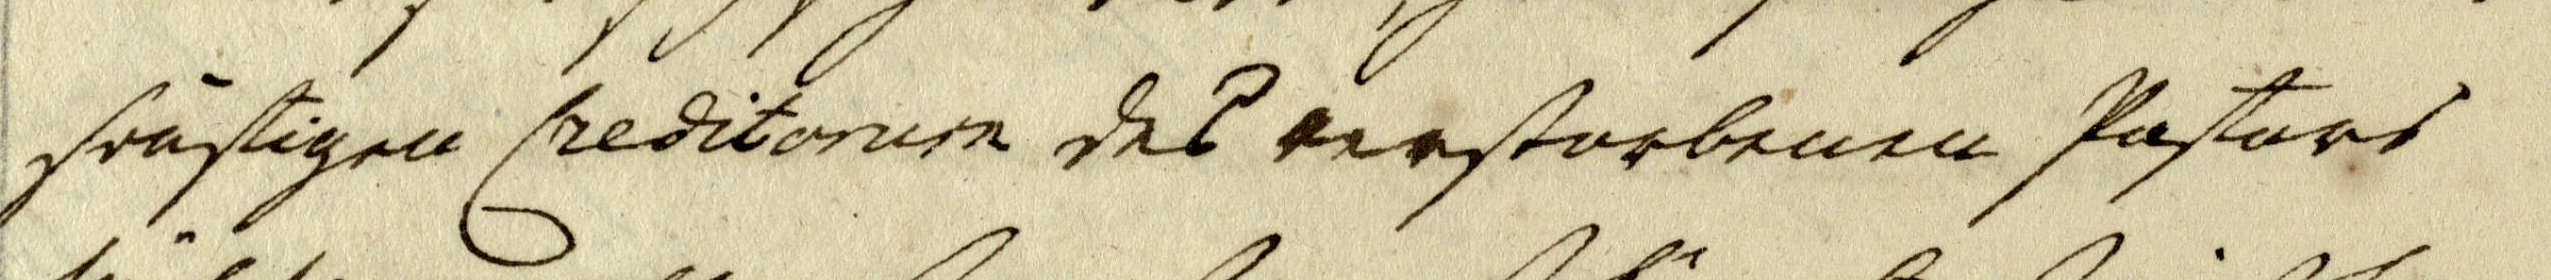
sonstigen Creditorum des verstorbenen Pastors
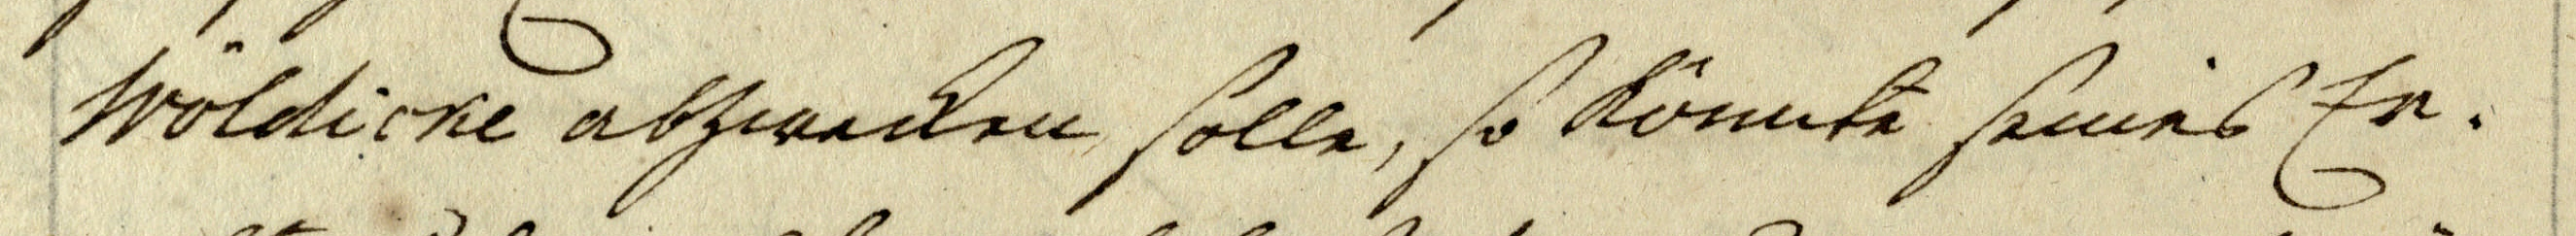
Wöldicke abzwecken solle, so könnte seines Er¬
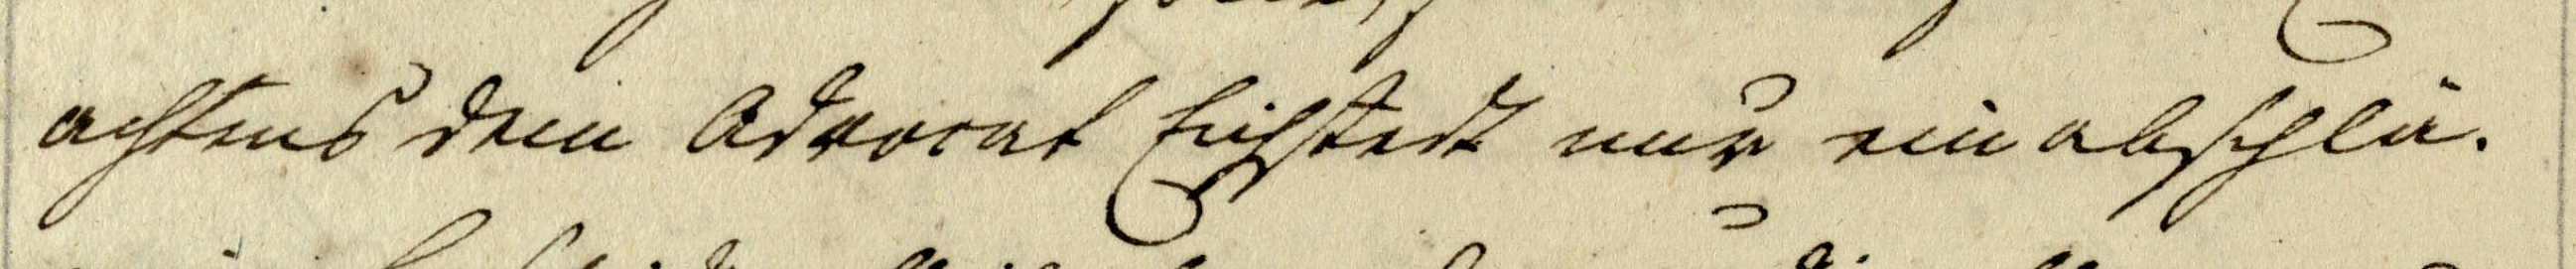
achtens dem Advocat Eichstedt nur ein abschlä¬
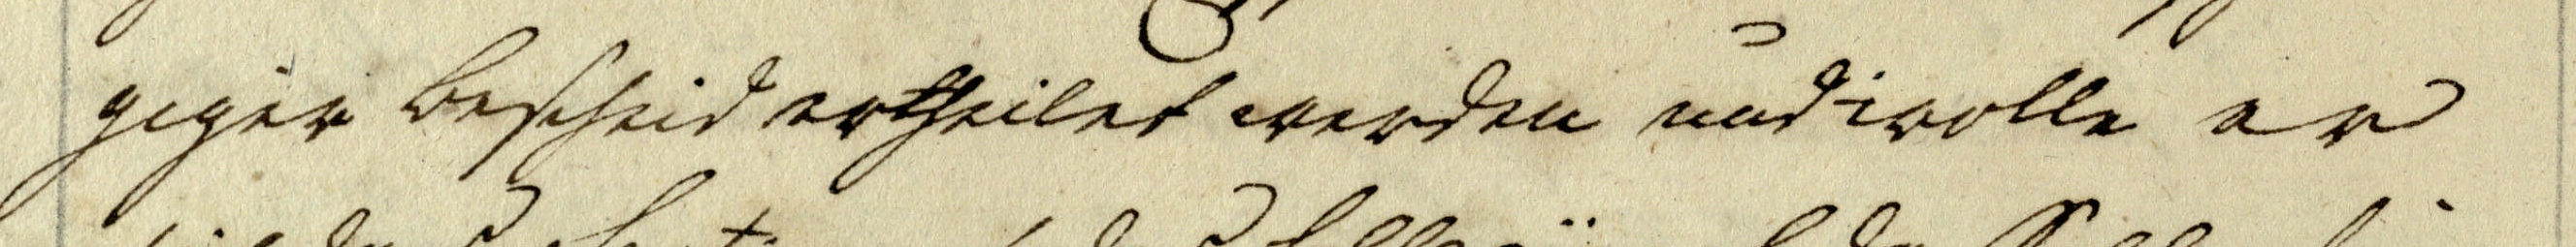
giger Bescheid ertheilet werden und wolle er
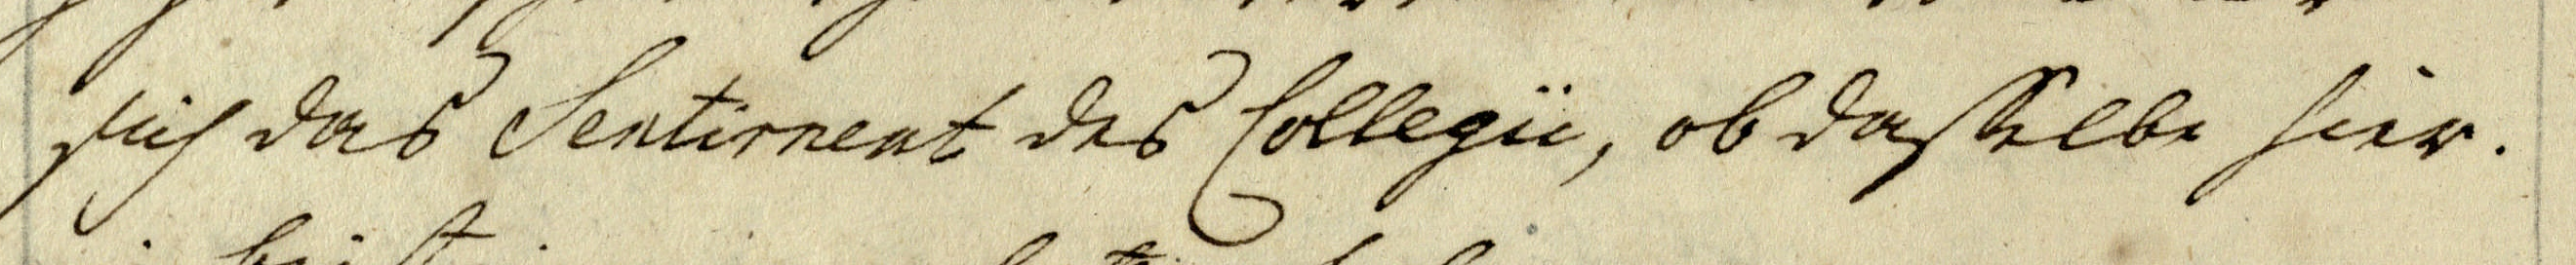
sich das Sentiment des Collegii, ob dasselbe hier¬
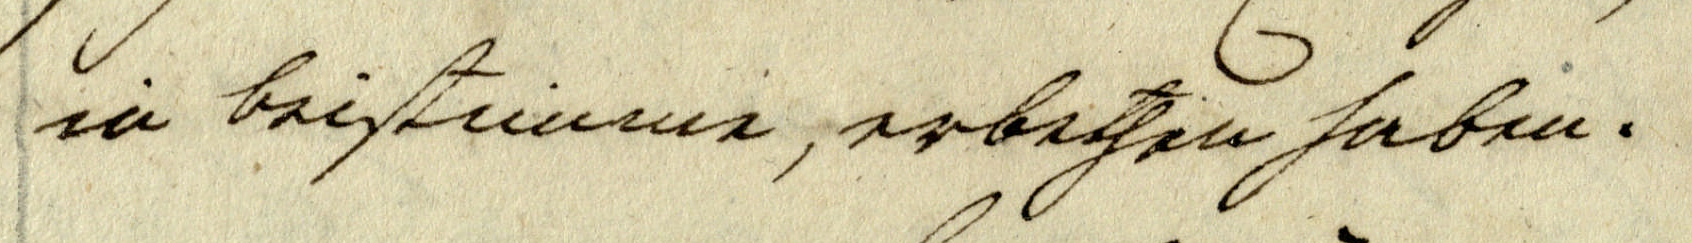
in beistimme, erbethen haben.
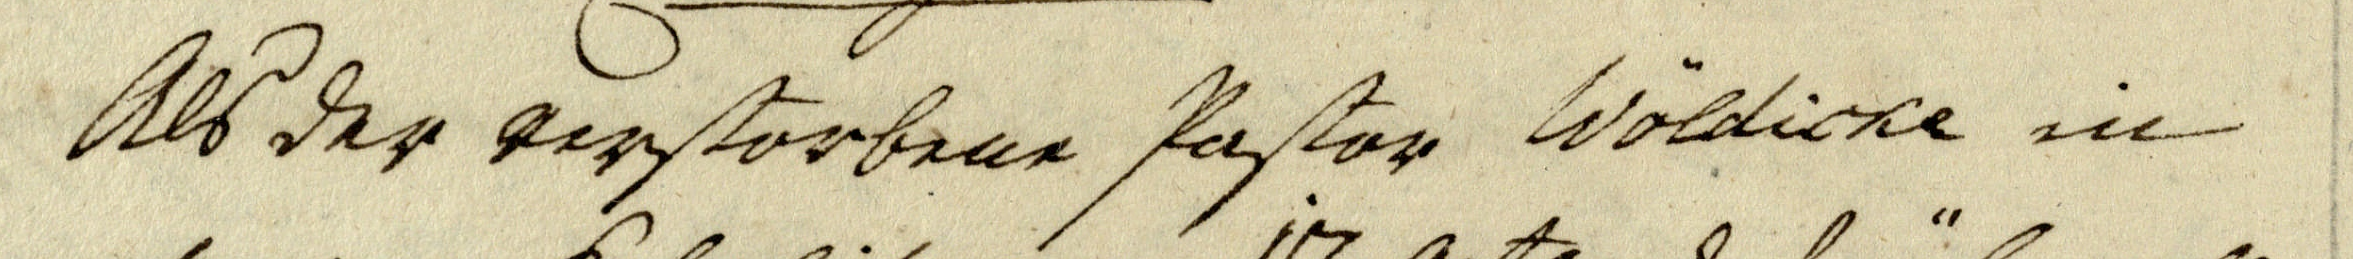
Als der verstorbene Pastor Wöldicke in
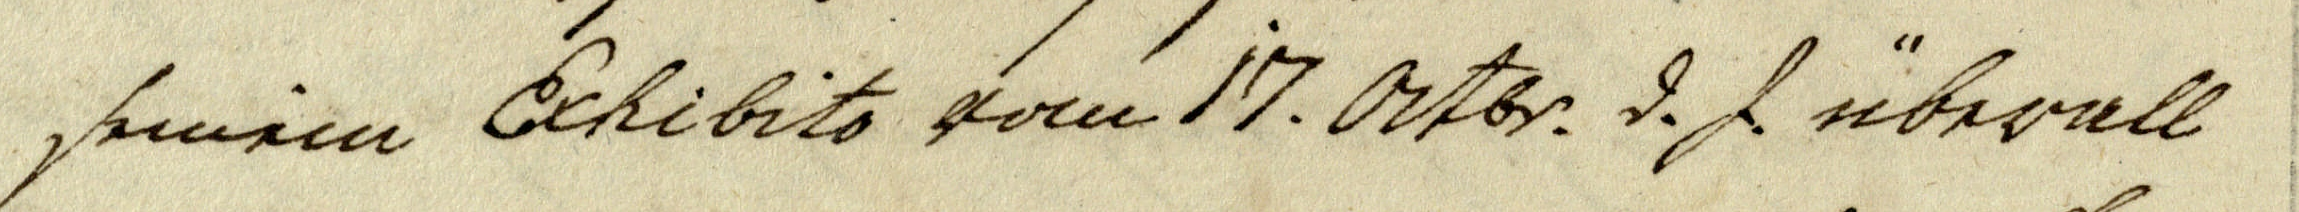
seinem Exhibito vom 17. Octbr. d. J. überall
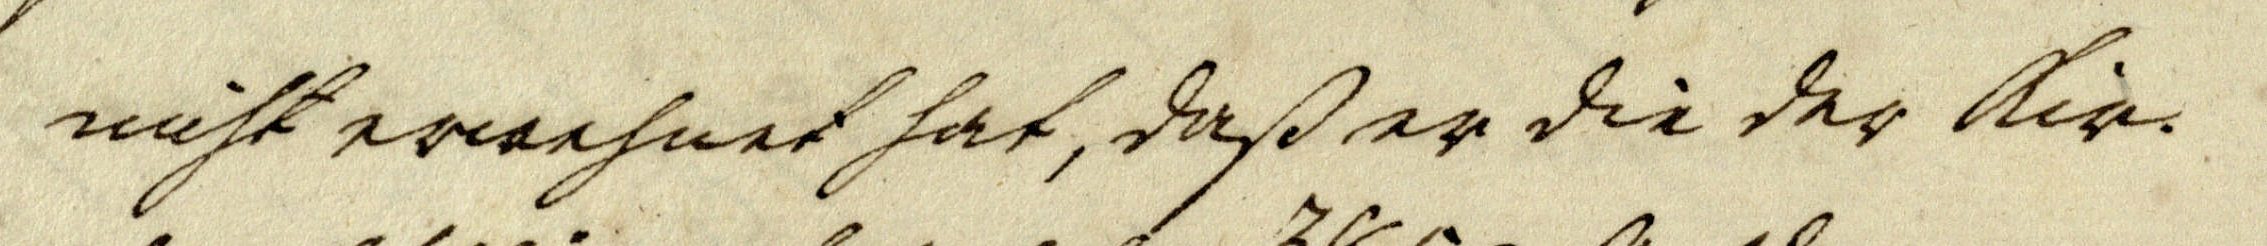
nicht erwehnet hat, daß er die der Kir¬
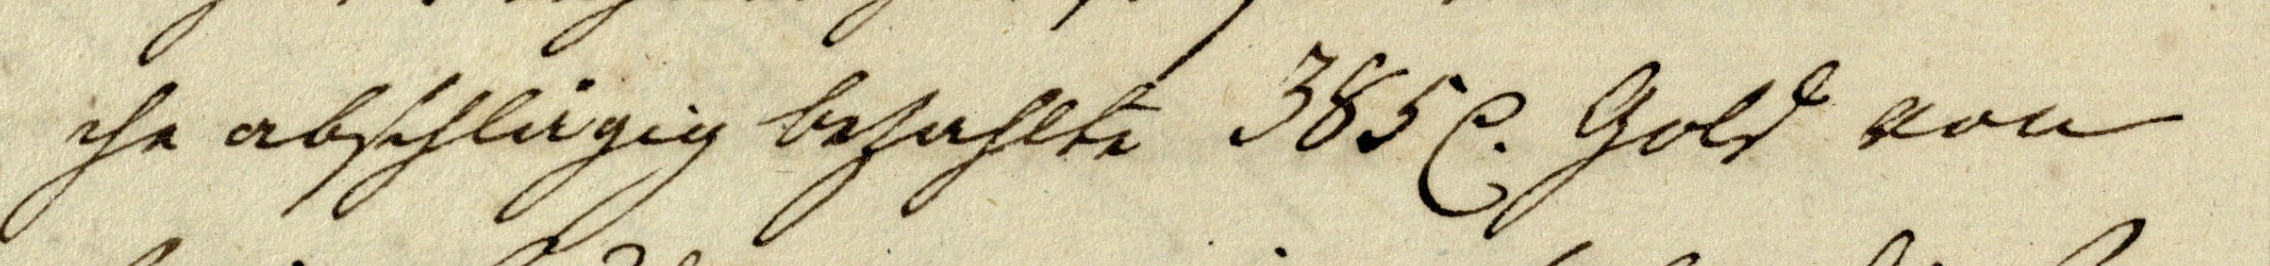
che abschlägig bezahlte 385 l. Gold von
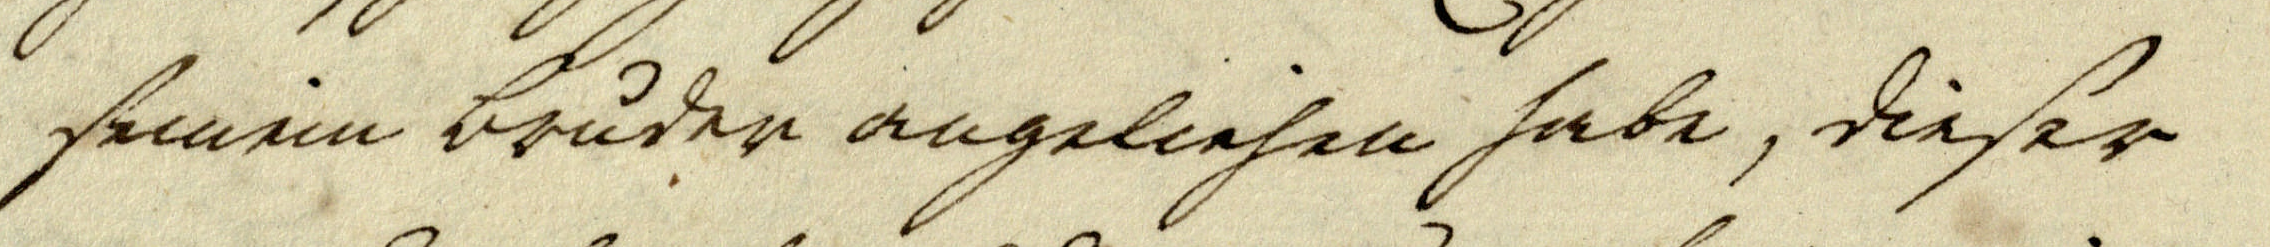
seinem Bruder angeliehen habe, dieser
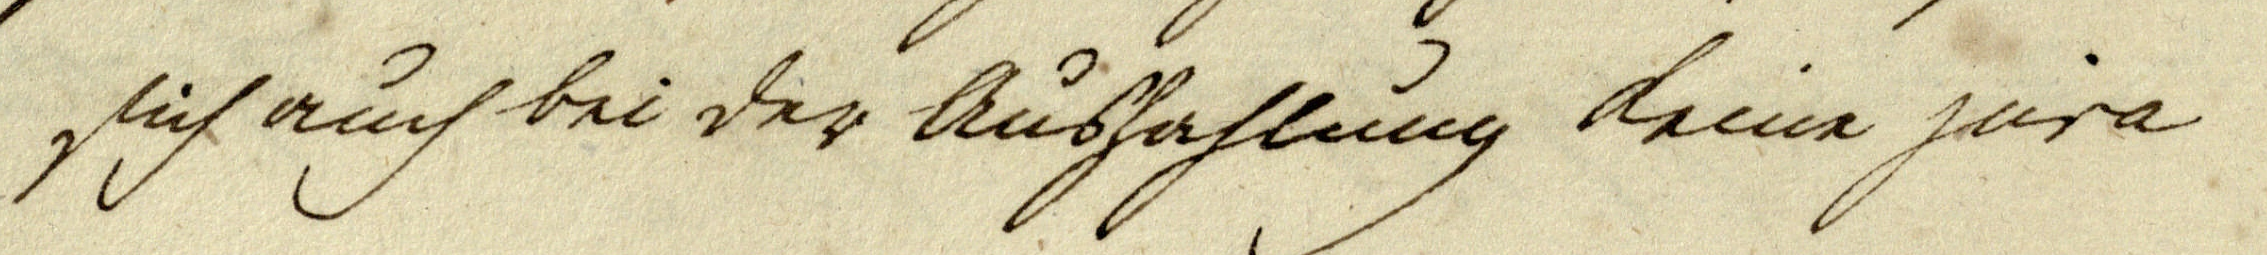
sich auch bei der Auszahlung keine jura
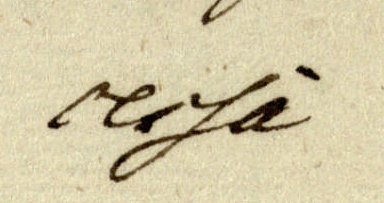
cessa
